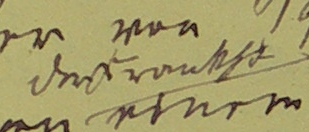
der Krankheit
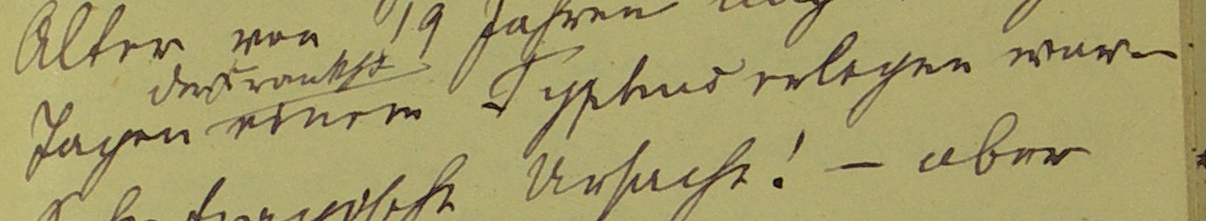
Tagen einem Typhus erlegen war.—
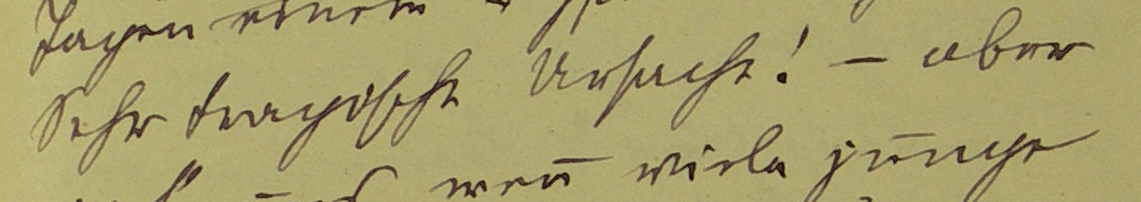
Sehr tragische Ursache!- Aber
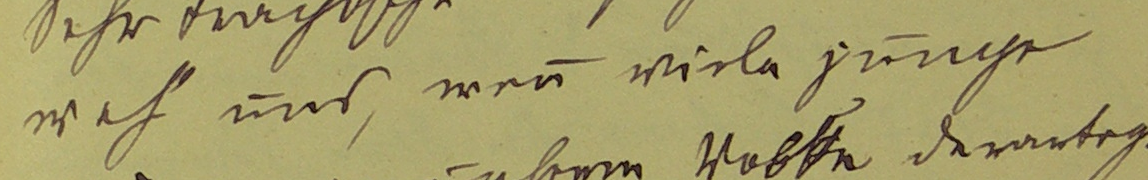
weh uns , wenn viele junge
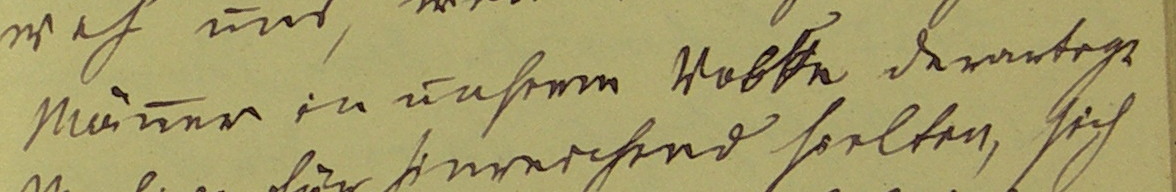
Männer in unserer Welt derartige
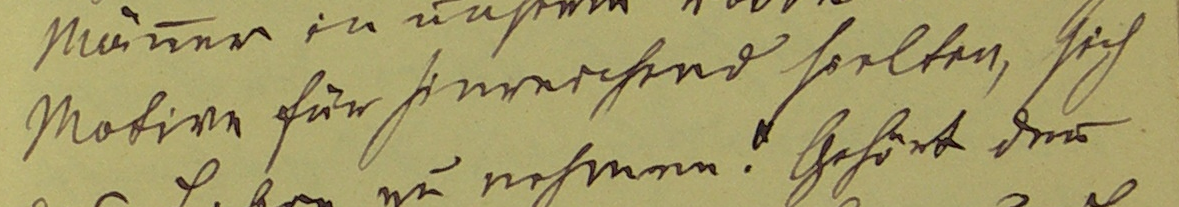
Motive für hinreichend hielten, sich
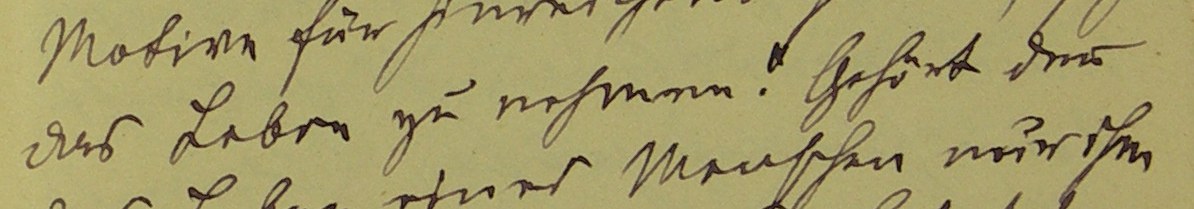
das Leben zu nehmen! Gehört den
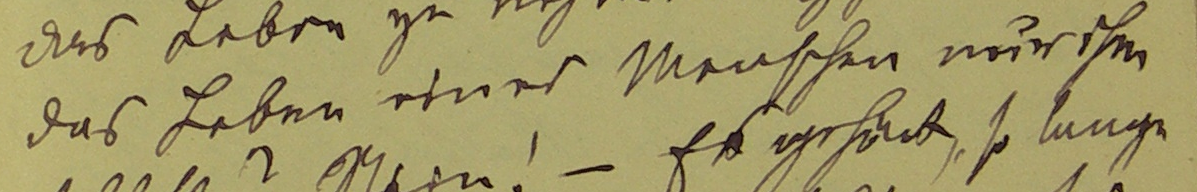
das Leben eines Menschen nur ihm
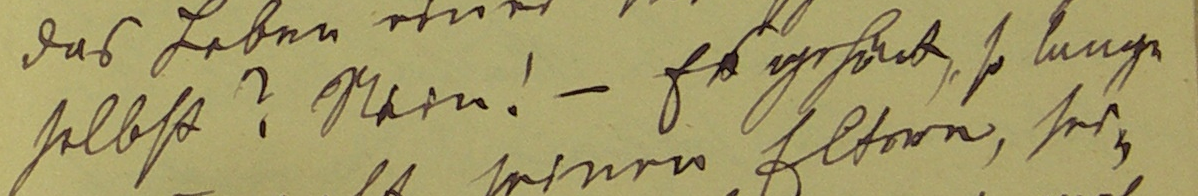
selbst ? Nein!- Es gehört so lange
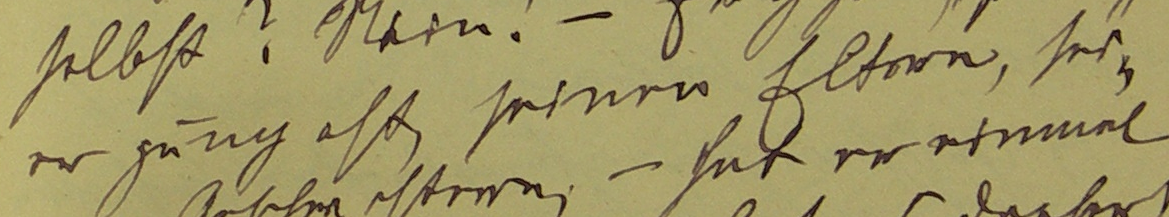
er jung ist seinen Eltern, sei¬
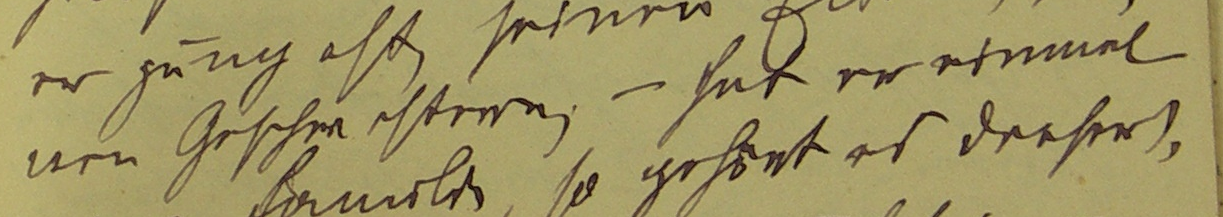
nen Geschwistern.- Hat er einmal
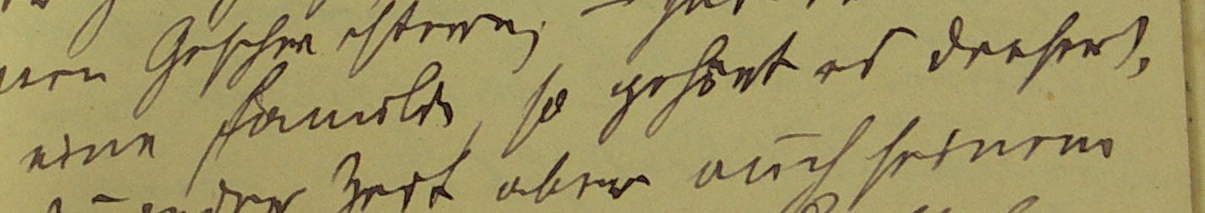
eine Familie so gehört es dieser.
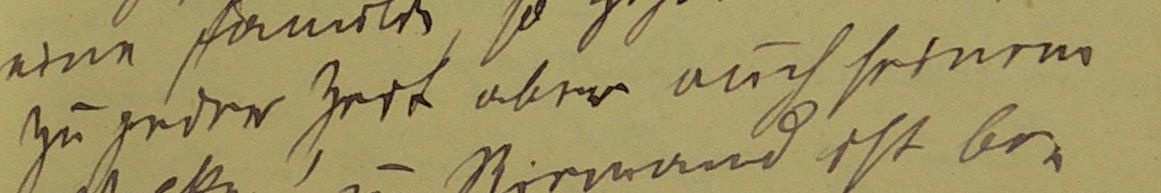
Zu jeder Zeit aber auch seinem
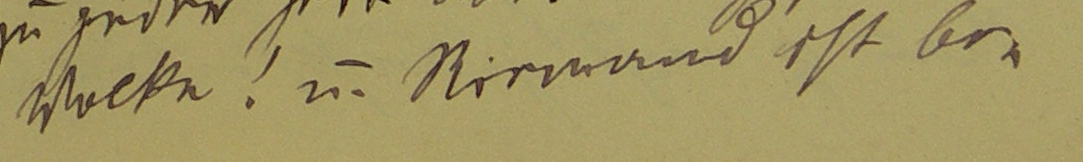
Volke! Und Niemand ist be
